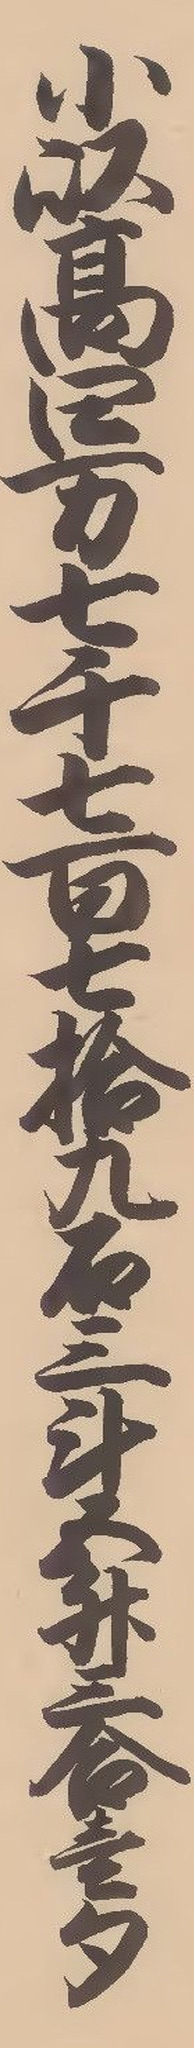小以髙四万七千七百七拾九石三斗五升三合壱夕

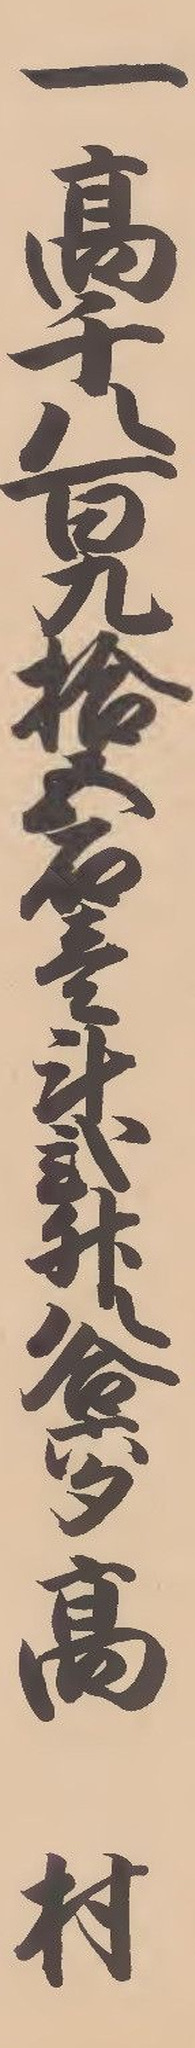一髙千八百九拾五石壱斗弐升八合六夕髙村
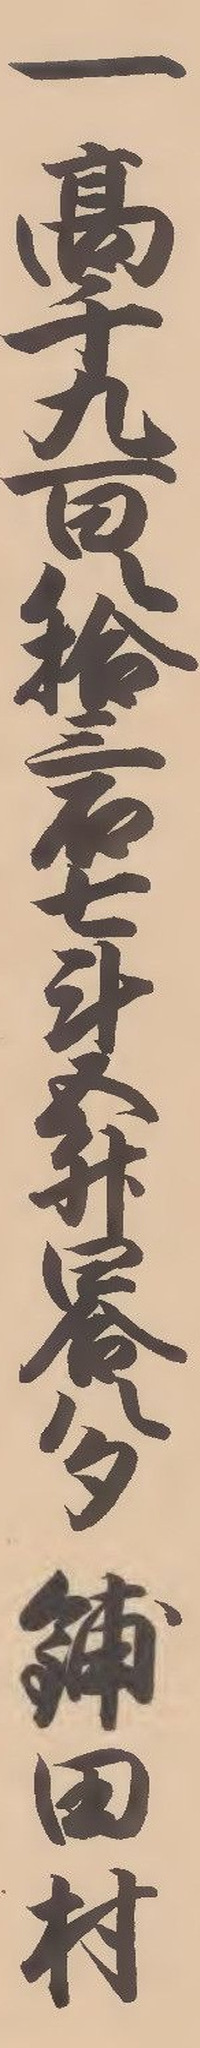一髙千九百八拾三石七斗五升四合八夕鋪田村
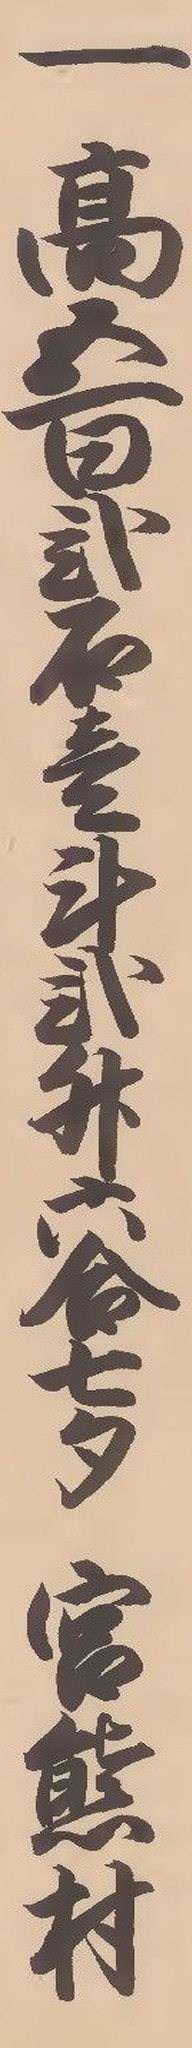一髙五百弐石壱斗弐升六合七夕宮熊村
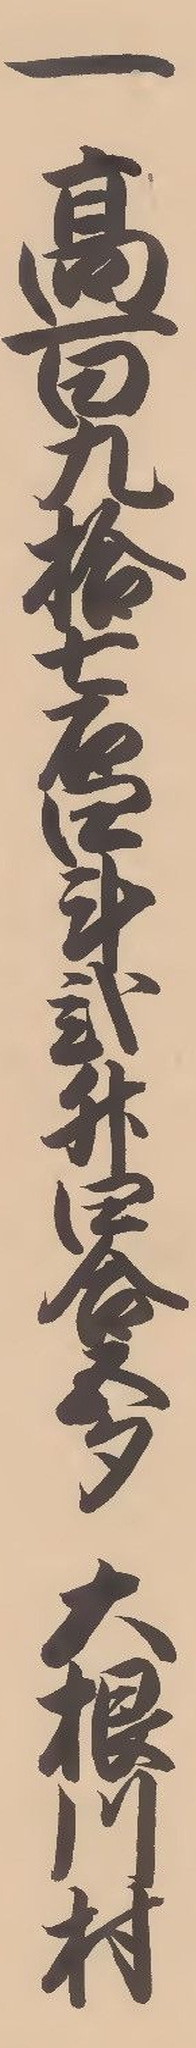一髙百九拾七石四斗弐升四合五夕大根川村
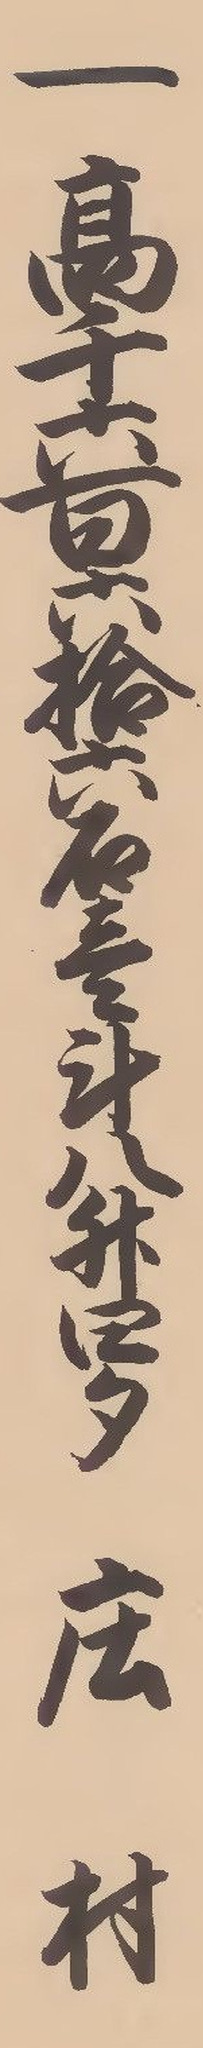一髙千六百六拾六石壱斗八升四夕庄村
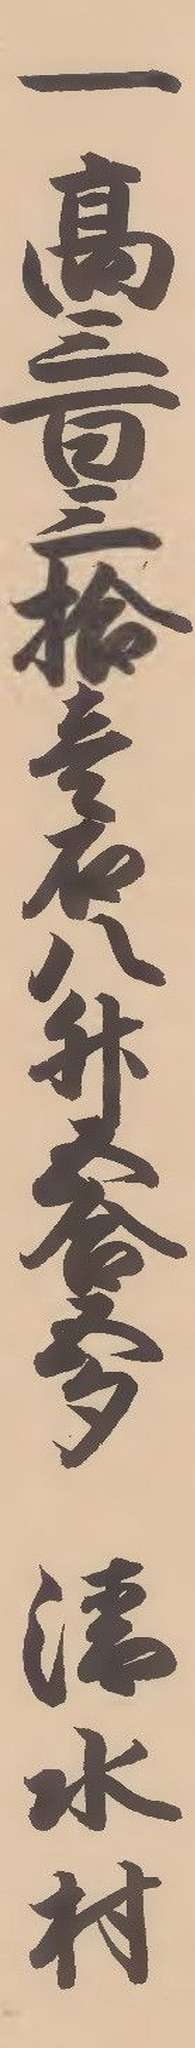一髙三百三拾壱石八升五合五夕清水村
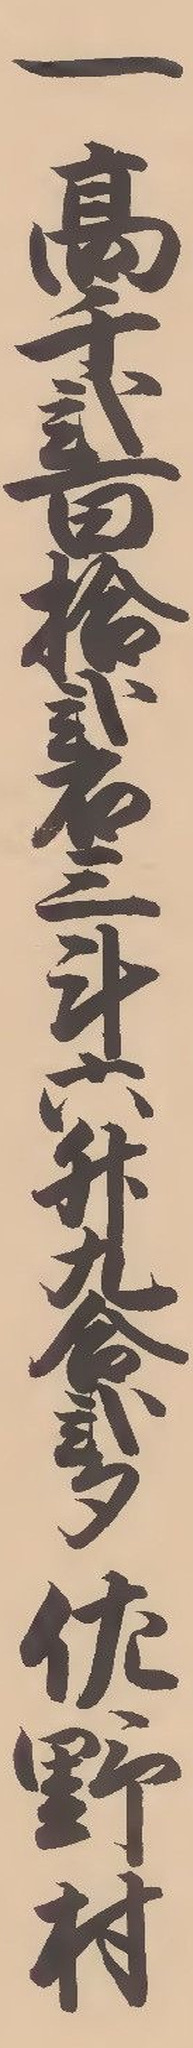一髙千弐百拾弐石三斗六升九合弐夕佐野村

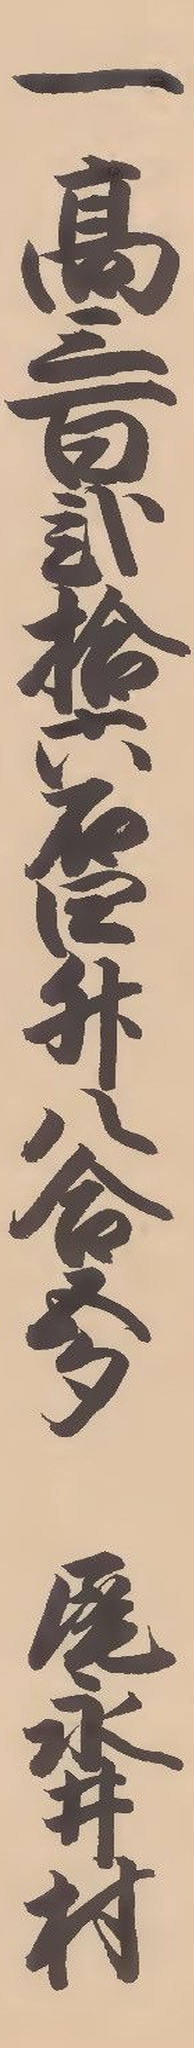一髙三百弐拾六石四升八合五夕尾永井村
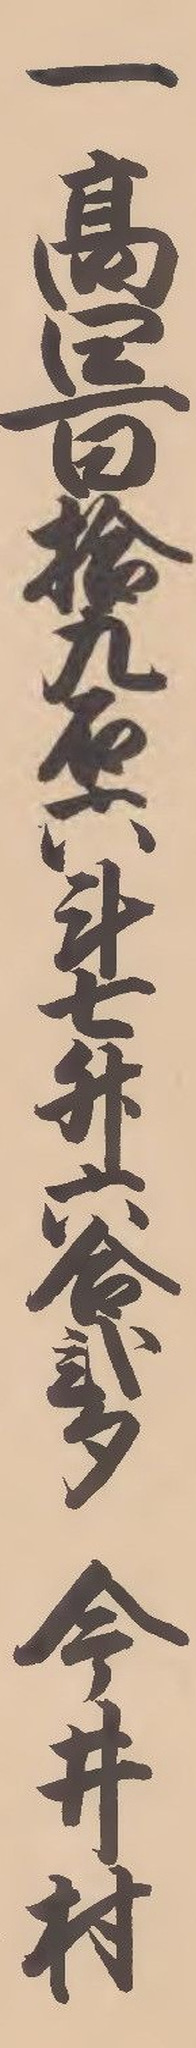一髙四百拾九石六斗七升六合弐夕今井村
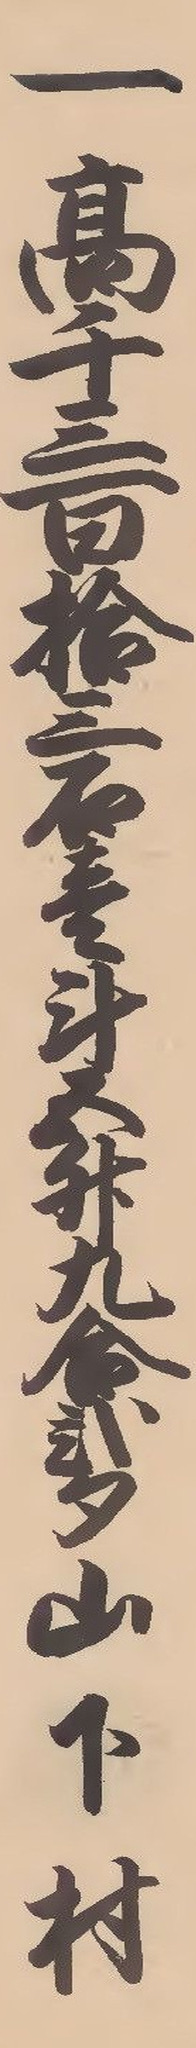一髙千三百拾三石壱斗五升九合弐夕山下村
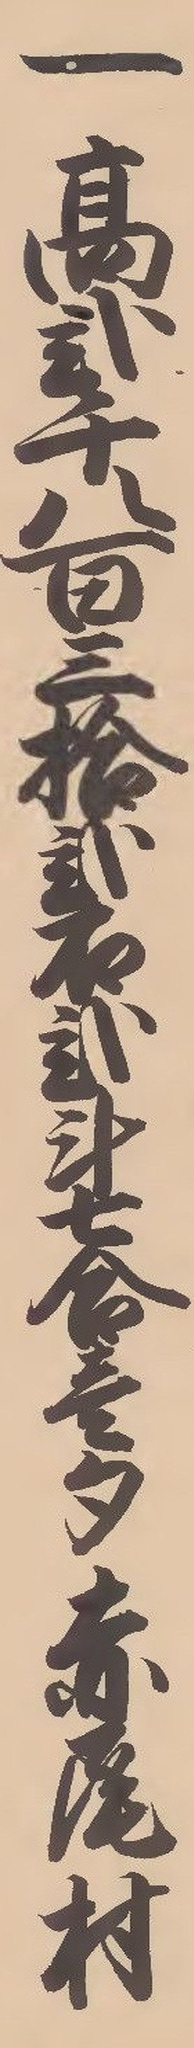一髙弐千八百三拾弐石弐斗七合壱夕赤尾村
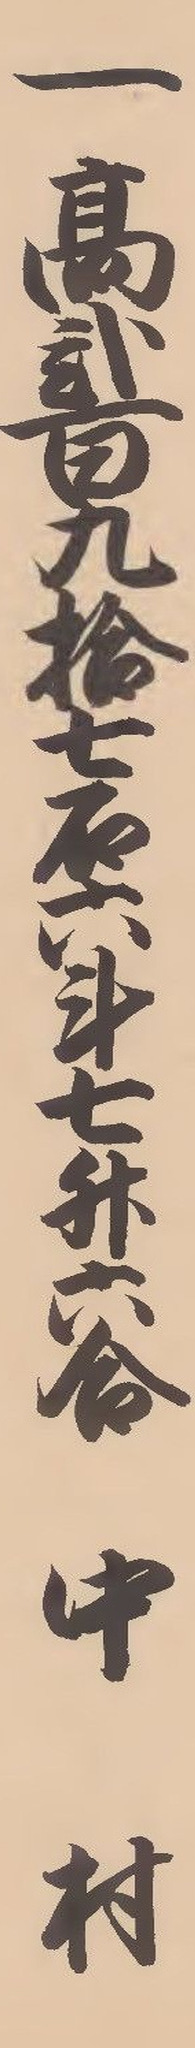一髙弐百九拾七石六斗七升六合中村
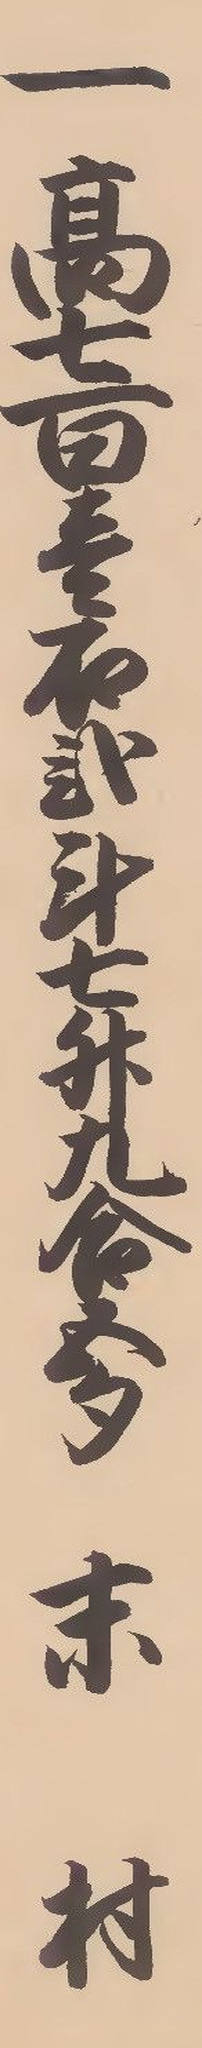一髙七百壱石弐斗七升九合五夕末村
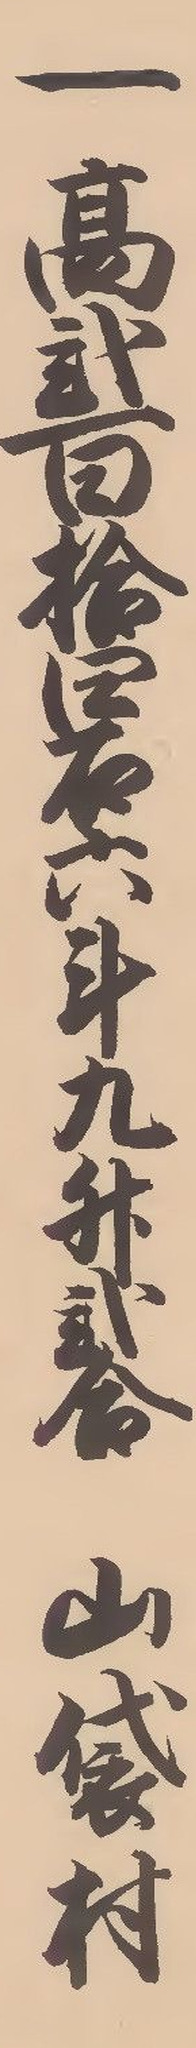一髙弐百拾四石六斗九升弐合山袋村
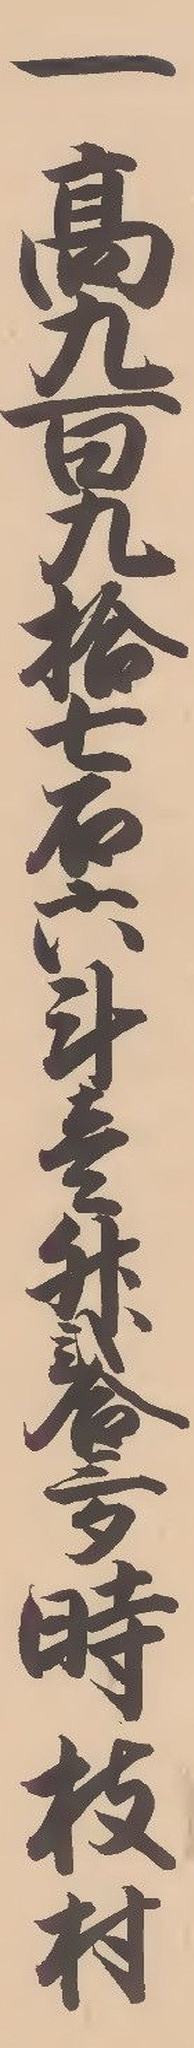一髙九百九拾七石六斗壱升弐合三夕時枝村
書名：豊前国郷帳
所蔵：国立公文書館 National Archives of Japan
